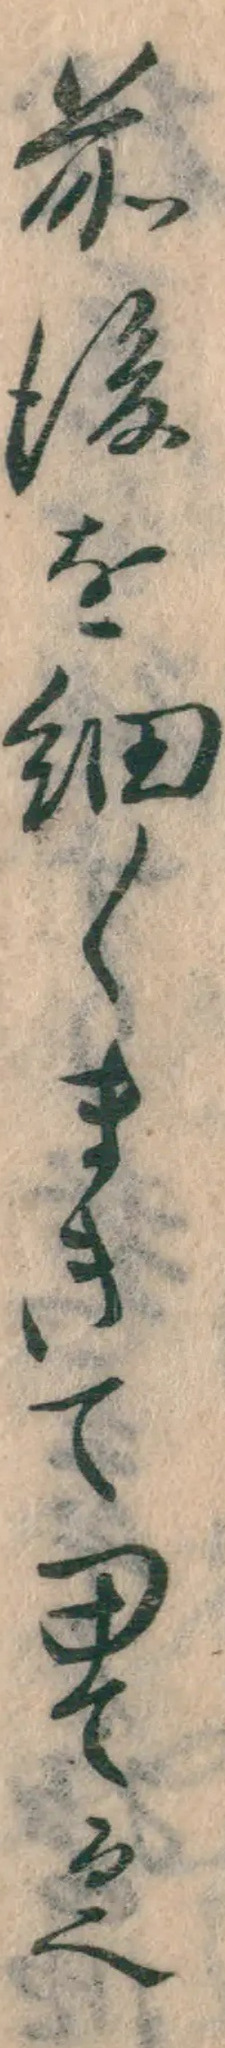前後を細くまきてゆてる也
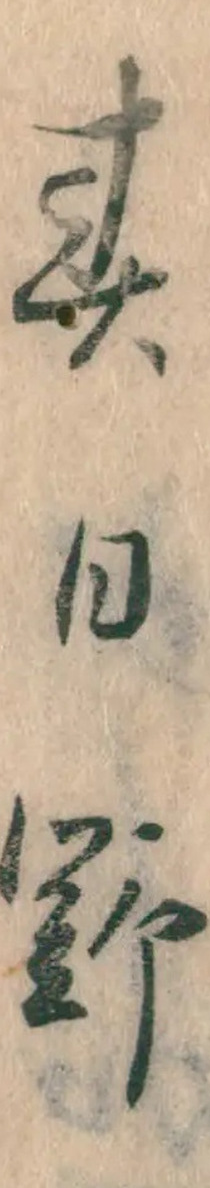春日野
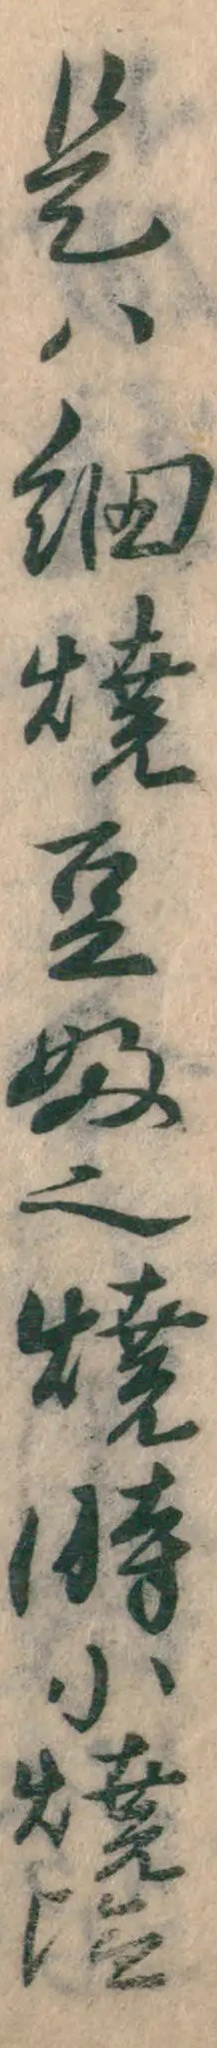是は細焼豆ふ也焼時に焼塩

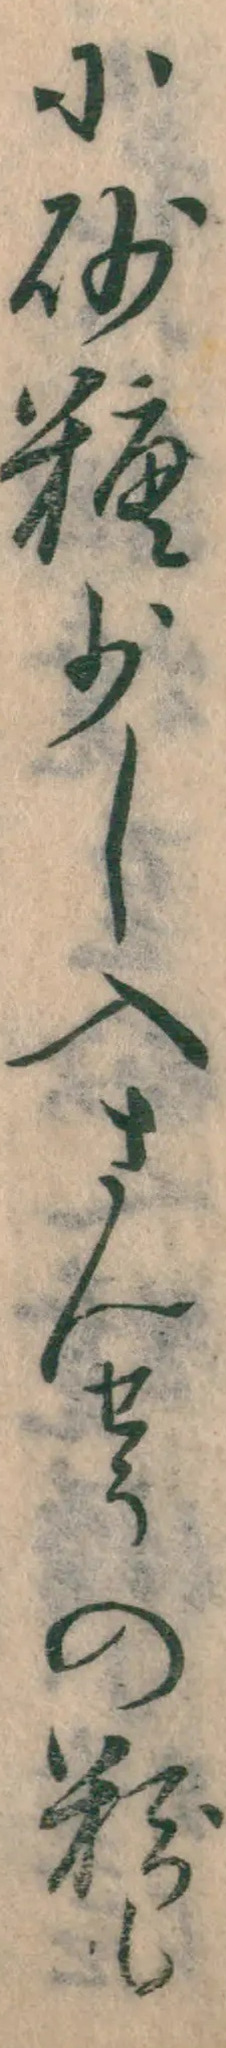に砂糖少し入さんせうの粉も
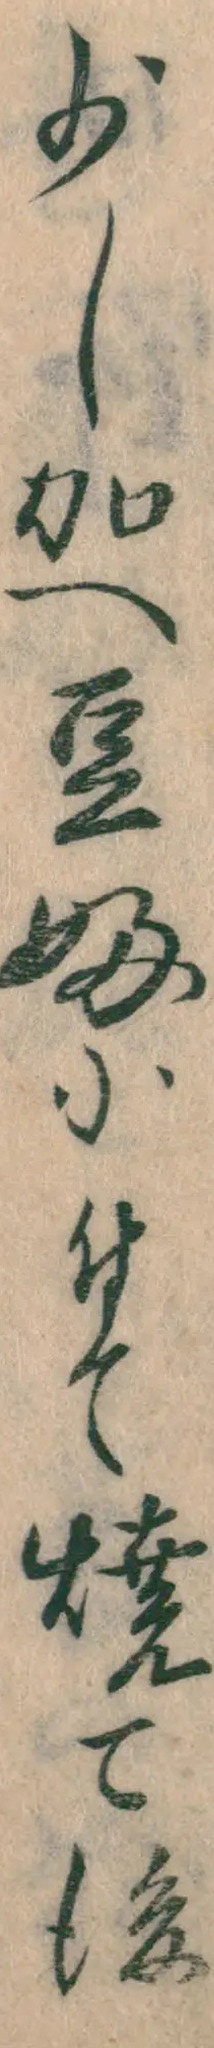少し加へ豆ふに付て焼て後
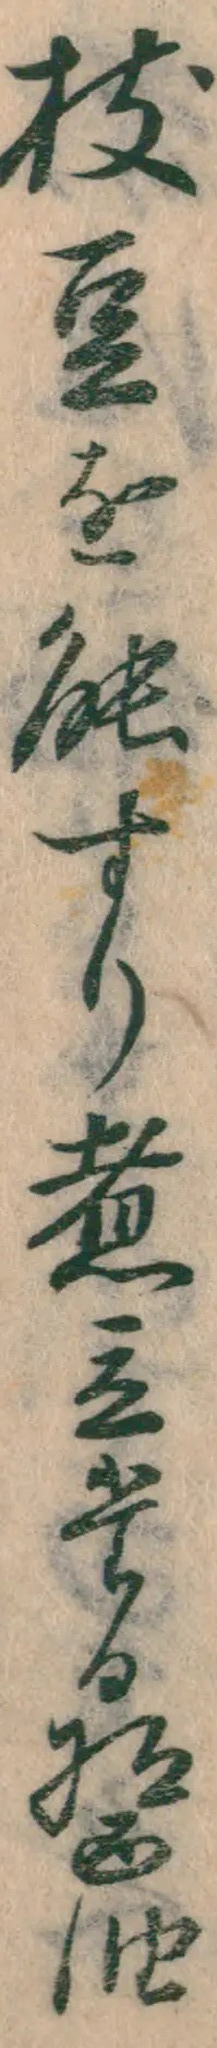枝豆を能すり煮立たる醤油
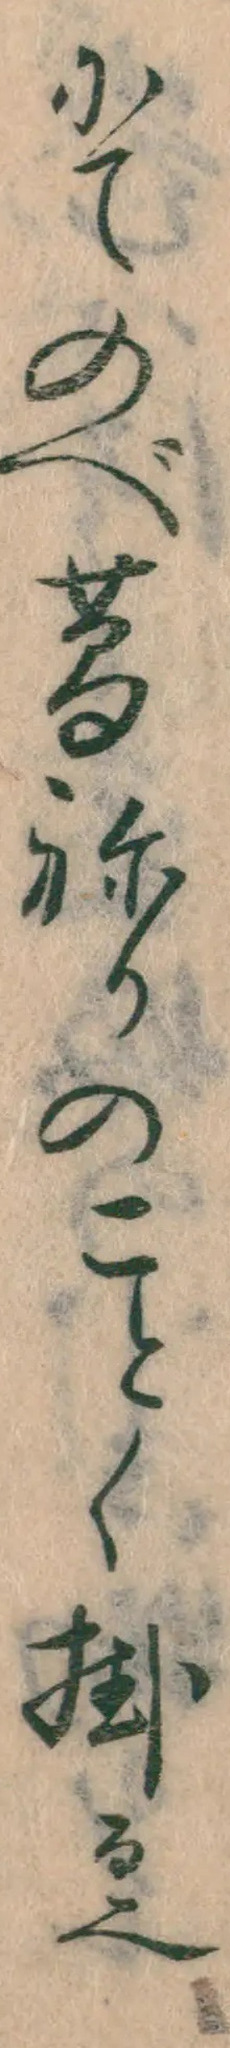にてのべ葛ねりのことく掛る也
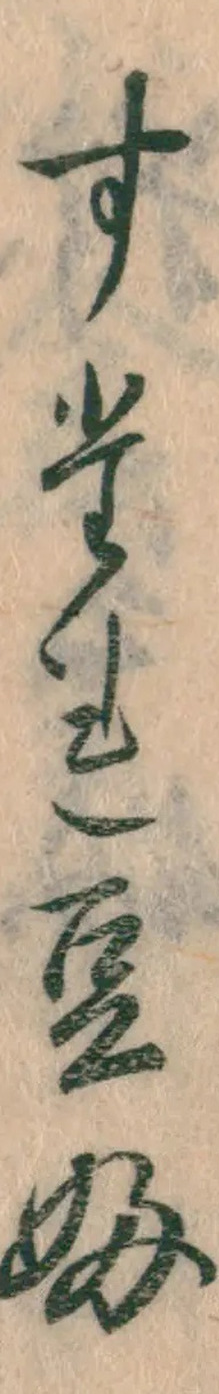すたれ豆ふ
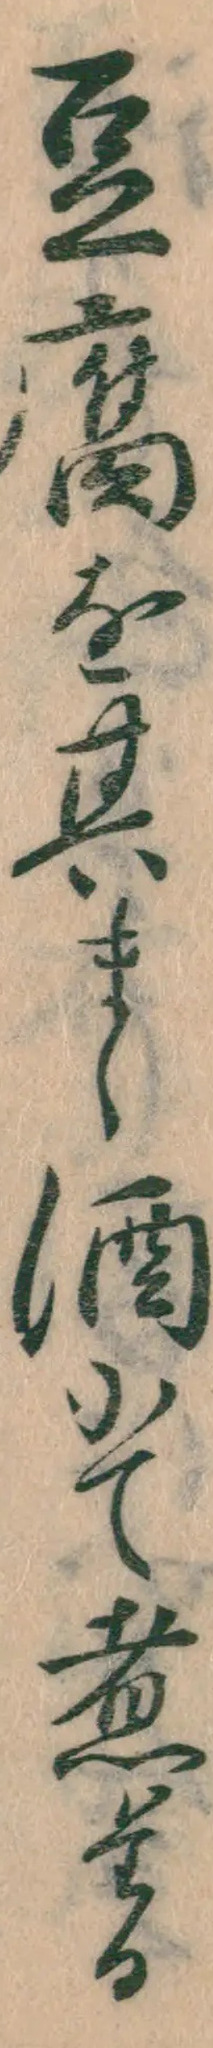豆腐を其まゝ酒にて煮たる
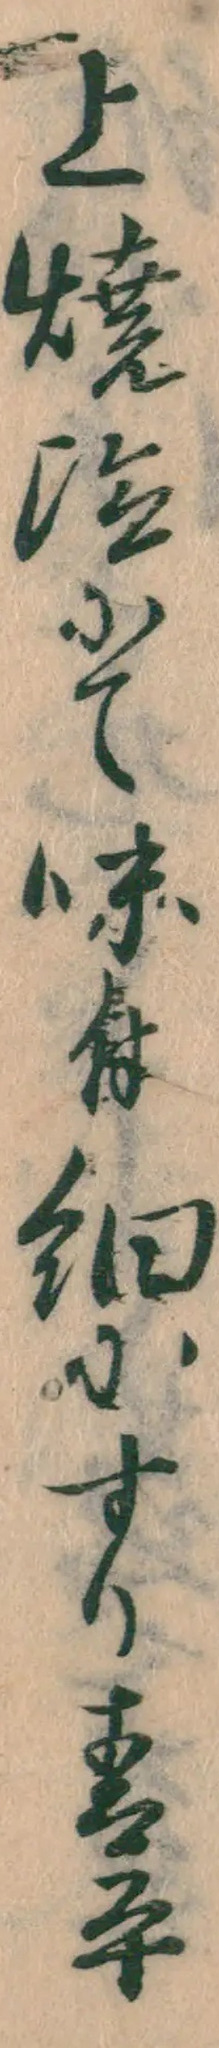上焼塩にて味付細にすり青平
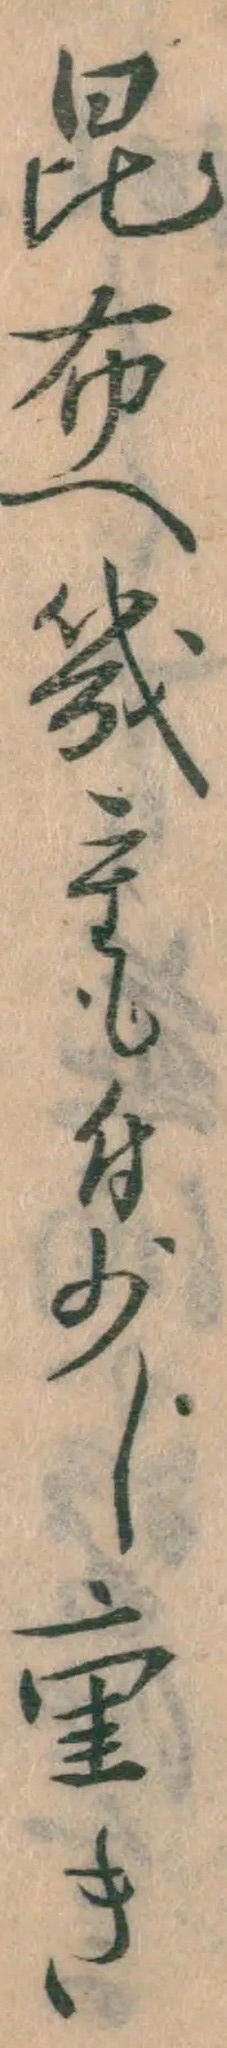昆布へ幾重も付少し重き
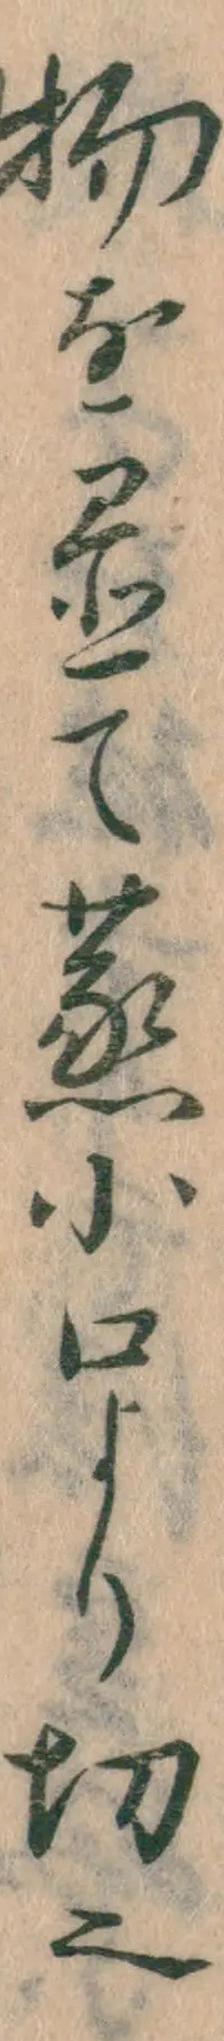物を置て蒸小口より切也
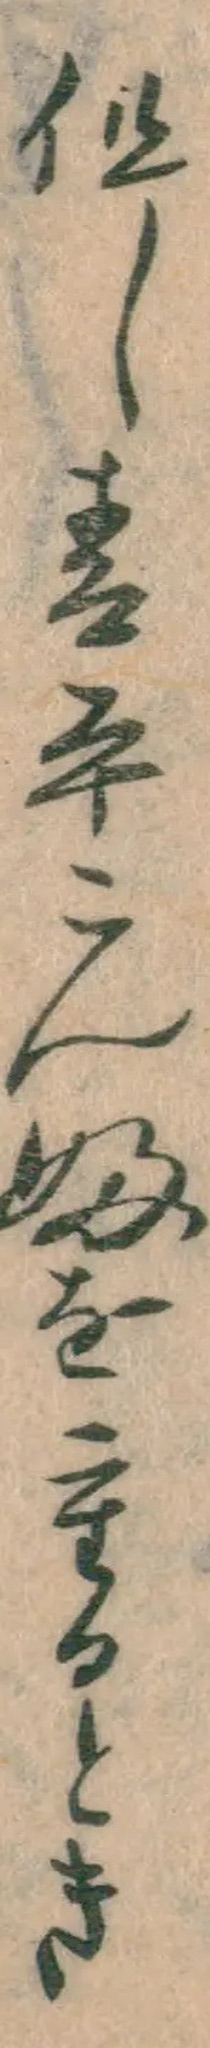但し青平こんふを重るとき
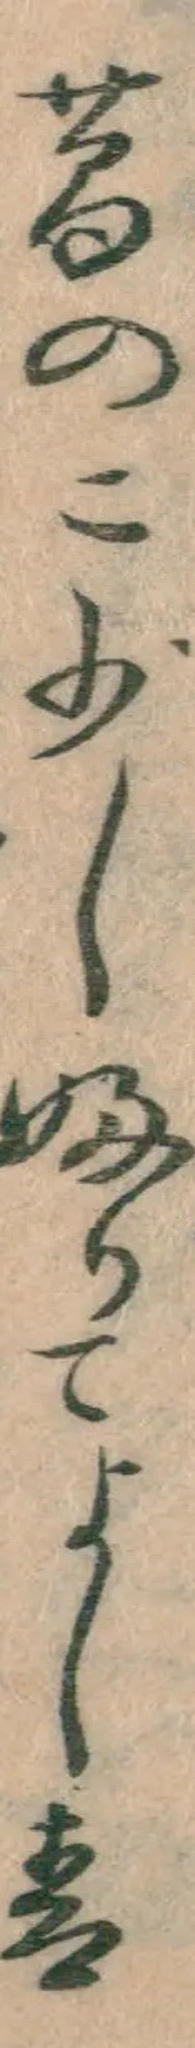葛のこ少しふりてよし青
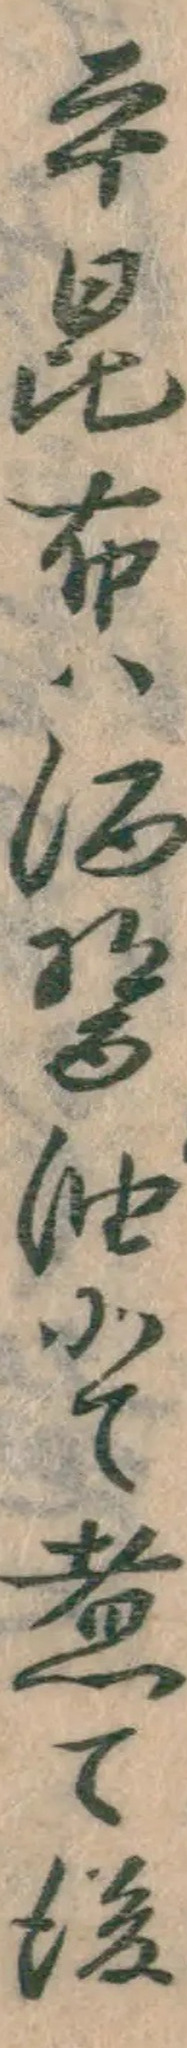平昆布は酒醤油にて煮て後
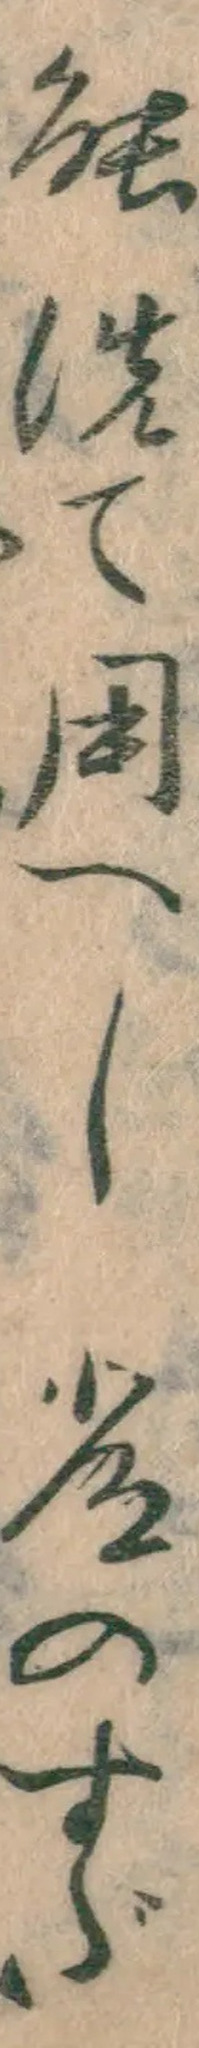能洗て用へし常のすだ
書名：豆腐百珍余録
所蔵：国立国会図書館 National Diet Library, JAPAN
